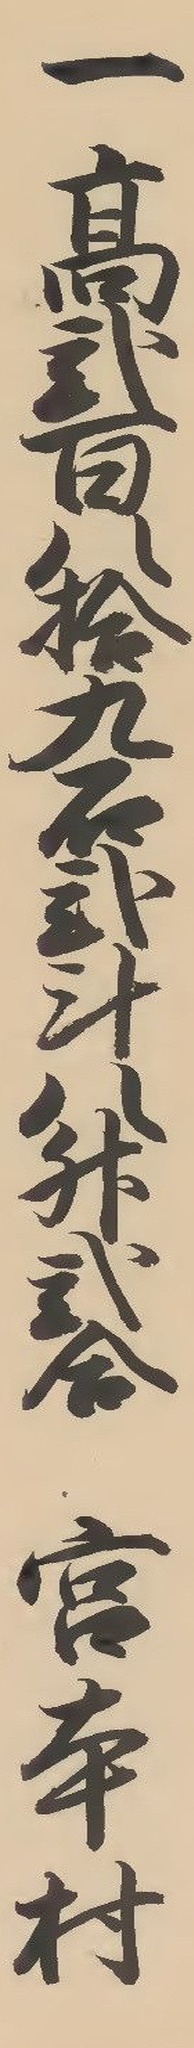一髙弐百八拾九石弐斗八升弐合宮本村

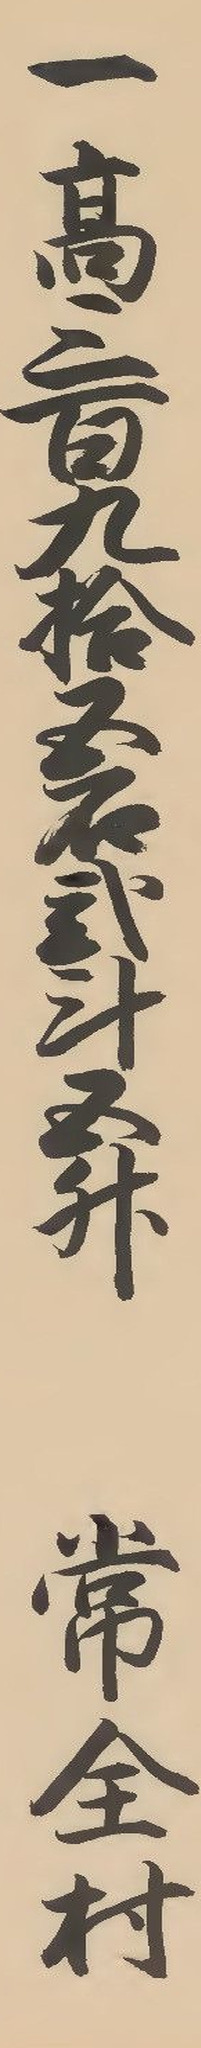一髙三百九拾五石弐斗五升常全村
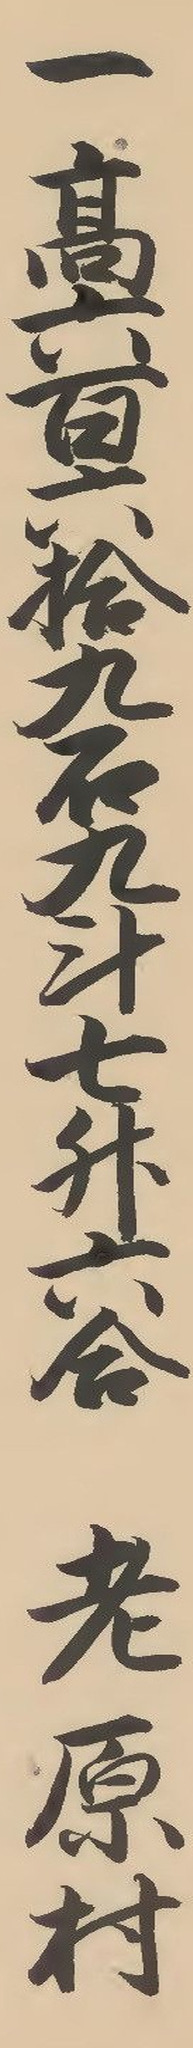一髙六百六拾九石九斗七升六合老原村
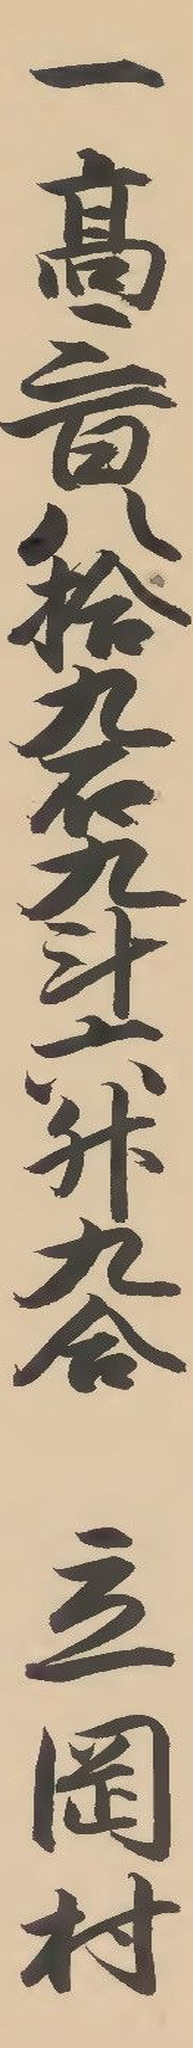一髙三百八拾九石九斗六升九合立岡村
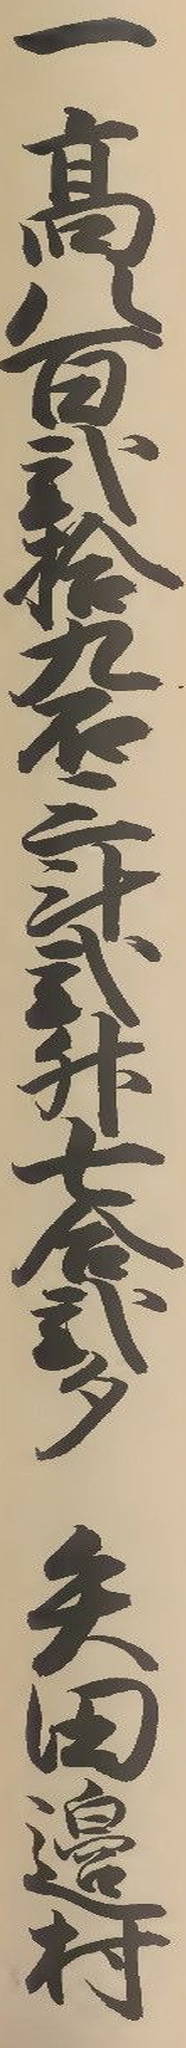一髙八百弐拾九石三斗弐升七合弐夕矢田邉村
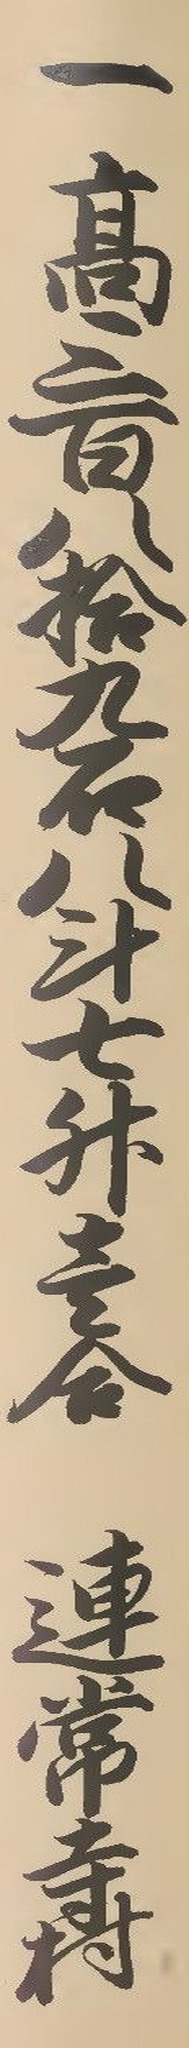一髙三百八拾九石八斗七升壱合連常寺村
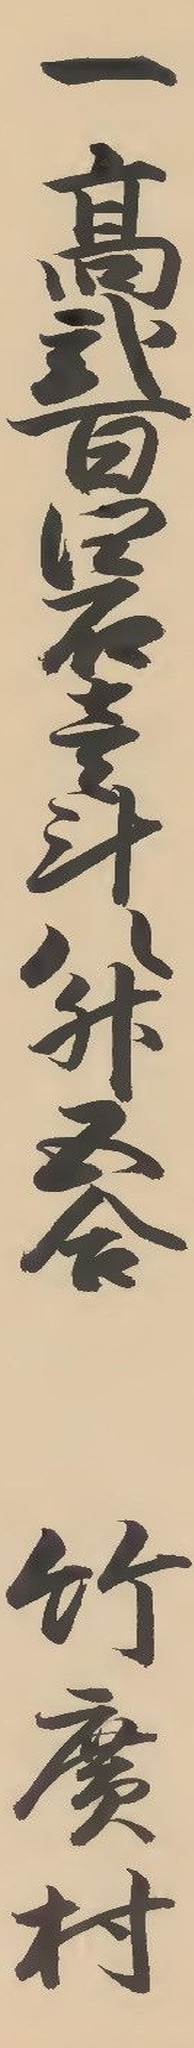一髙弐百四石壱斗八升五合竹廣村
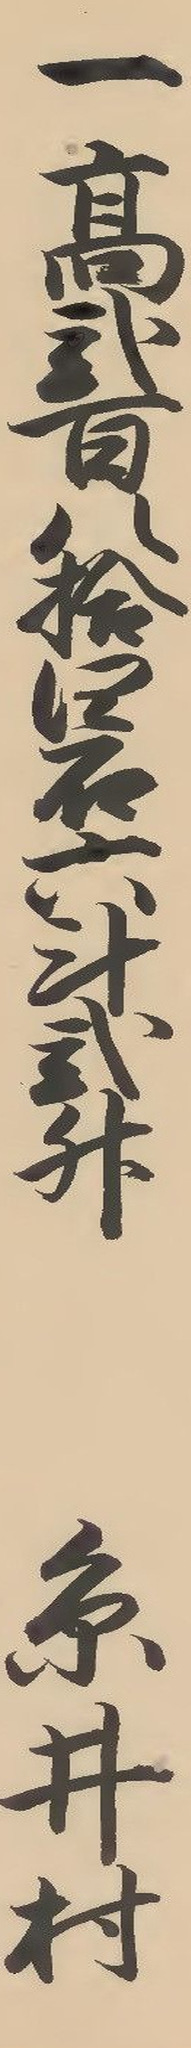一髙弐百八拾四石六斗弐升糸井村
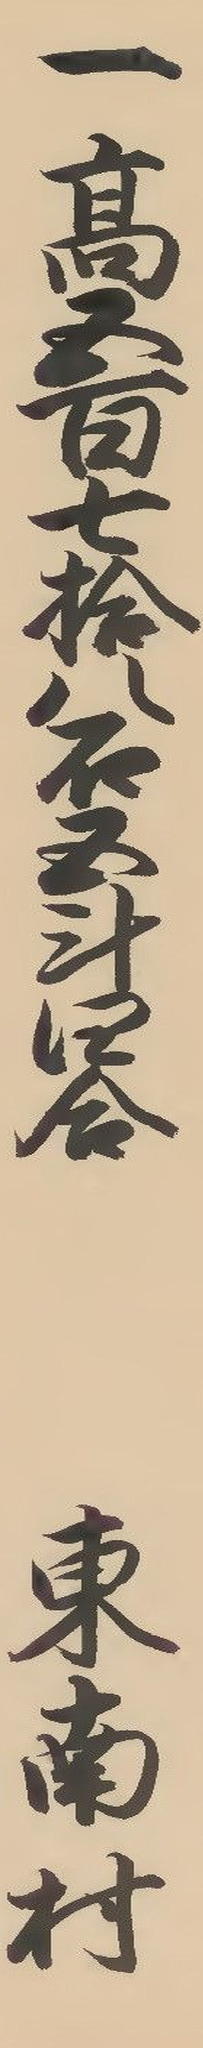一髙五百七拾八石五斗四合東南村

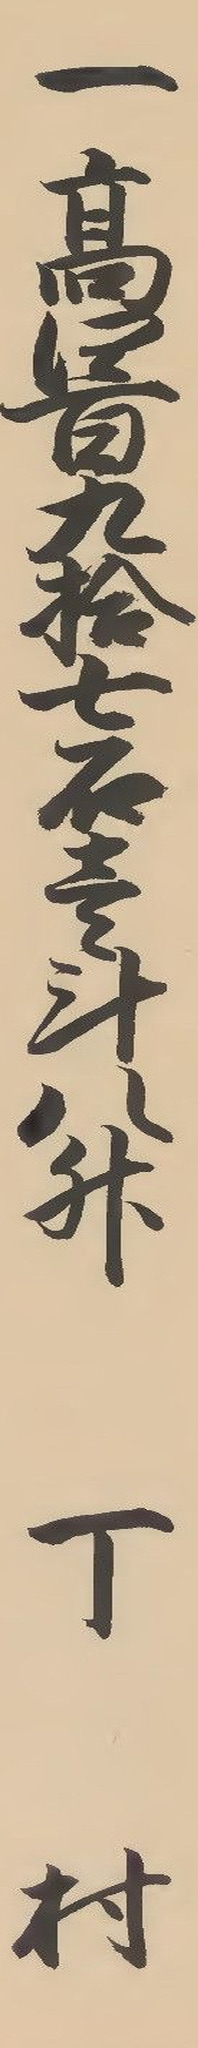一髙四百九拾七石壱斗八升丁村
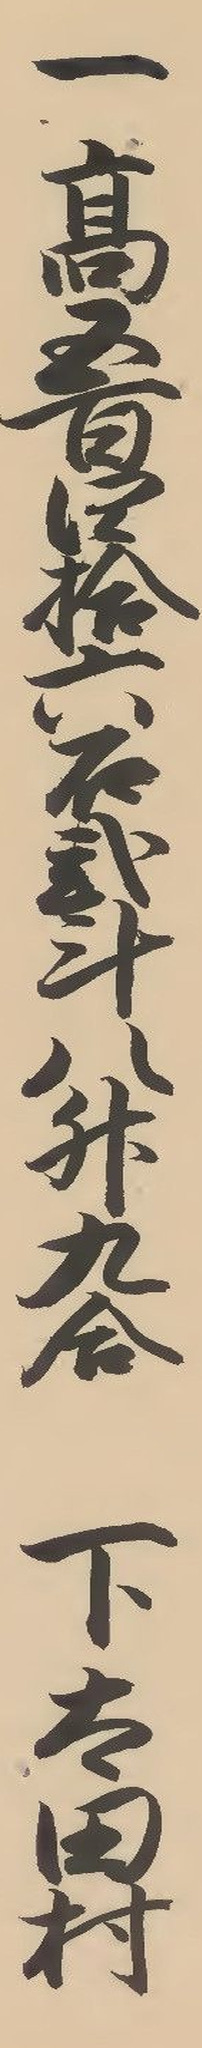一髙五百四拾六石弐斗八升九合下太田村
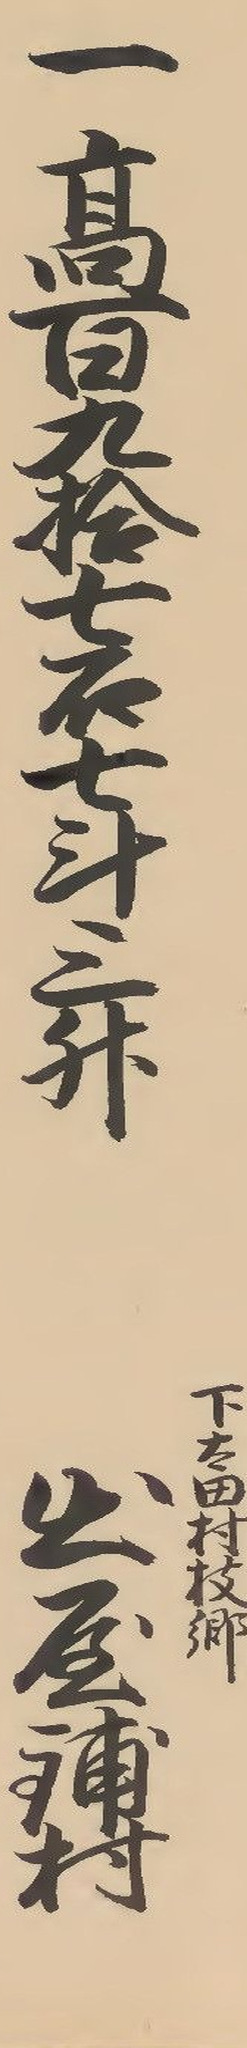一髙百九拾七石七斗三升出屋鋪村
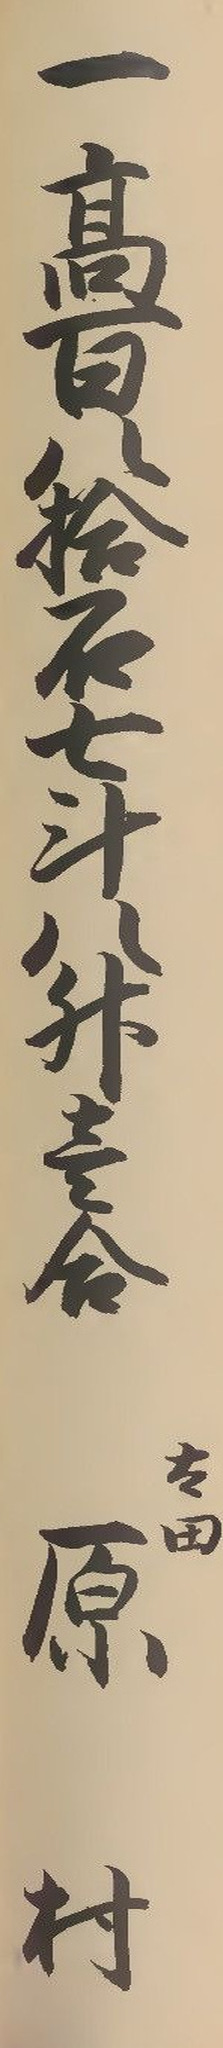一髙百八拾石七斗八升壱合原村
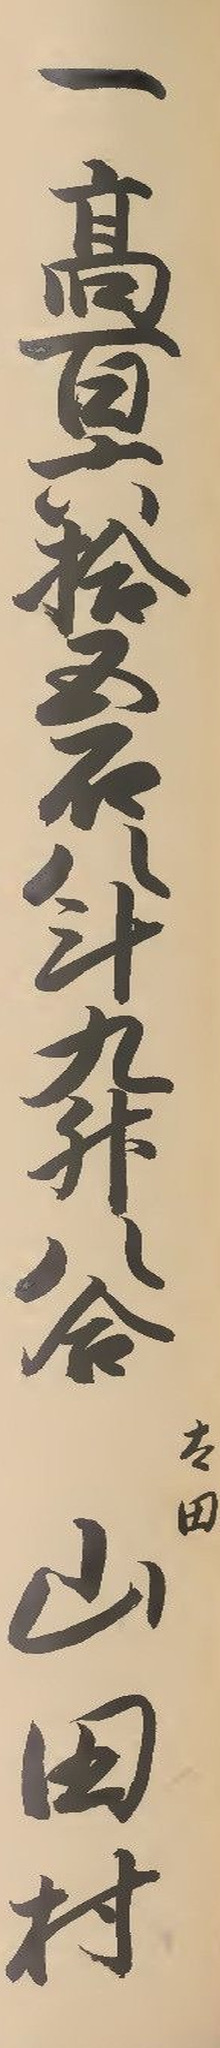一髙百六拾五石八斗九升八合山田村
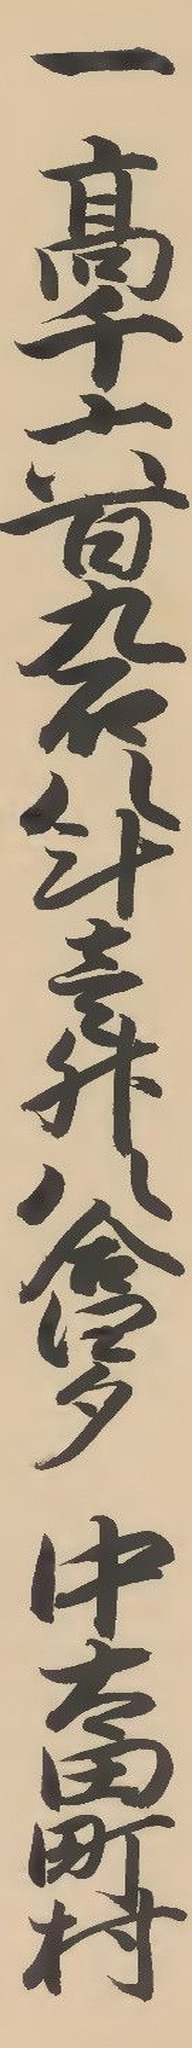一髙千六百九石八斗壱升八合四夕中太田町村
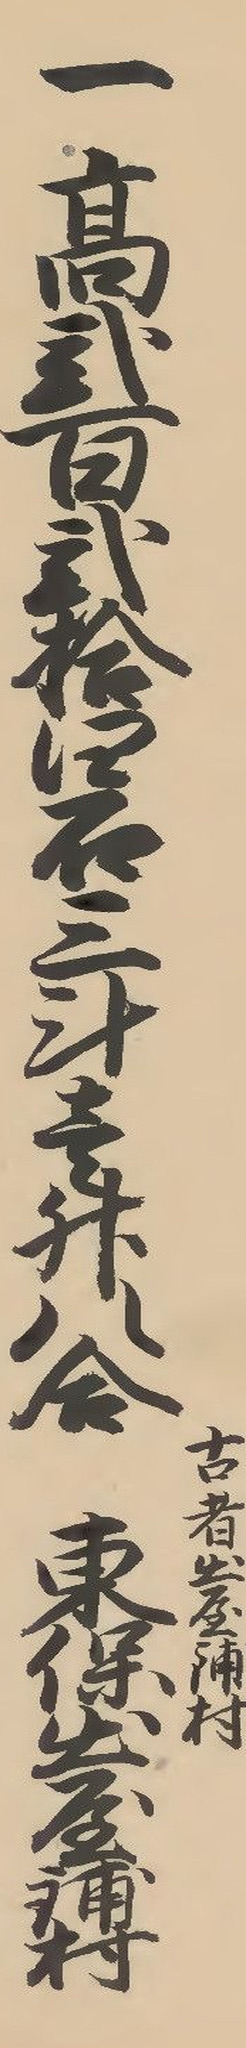一髙弐百弐拾四石三斗壱升八合東保出屋鋪村
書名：播磨国郷帳
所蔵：国立公文書館 National Archives of Japan
